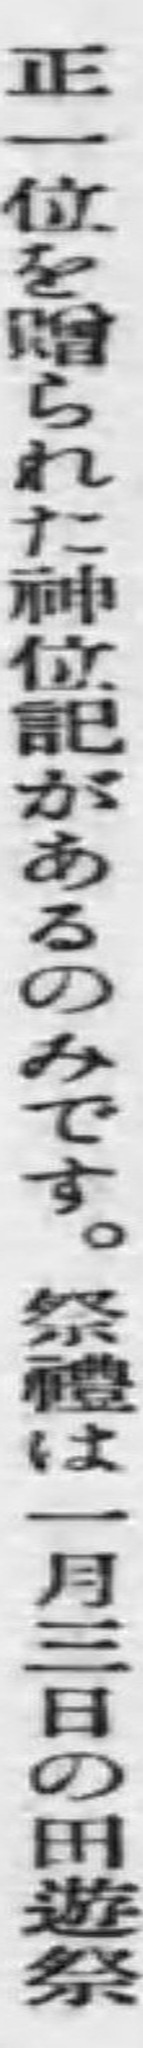正一位を贈られた神位記があるのみです。祭礼は一月三日の田遊祭
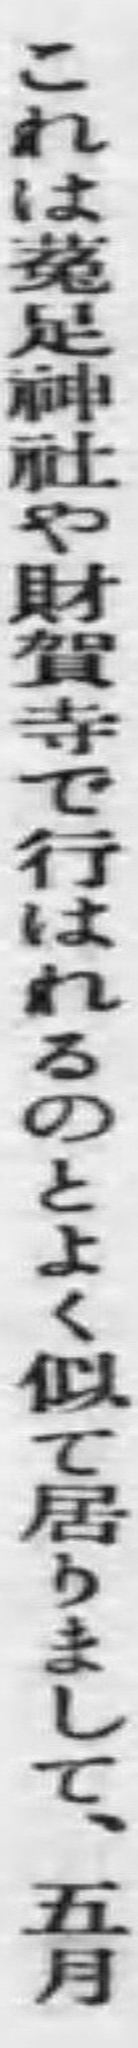これは菟足神社や財賀寺で行はれるのとよく似て居りまして、五月
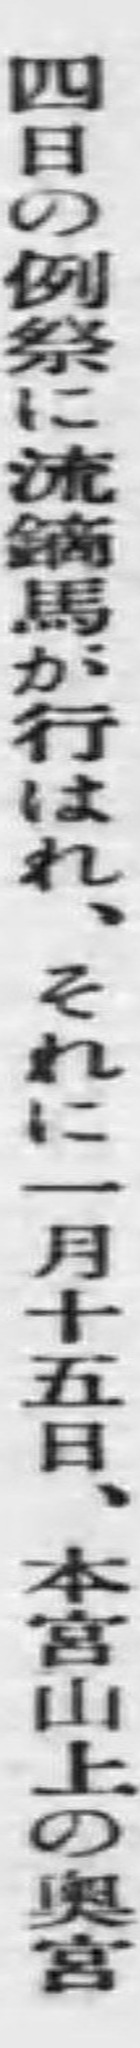四日の例祭に流鏑馬が行はれ、それに一月十五日、本宮山上の奥宮
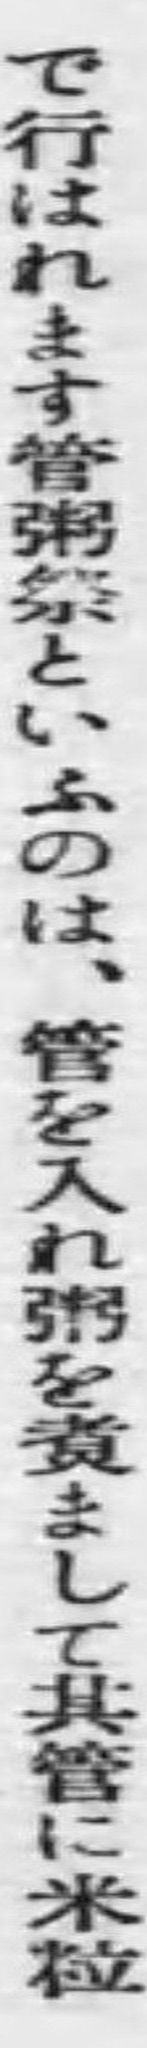で行はれます管粥祭といふのは、管を入れ粥を煮まして其管に米粒
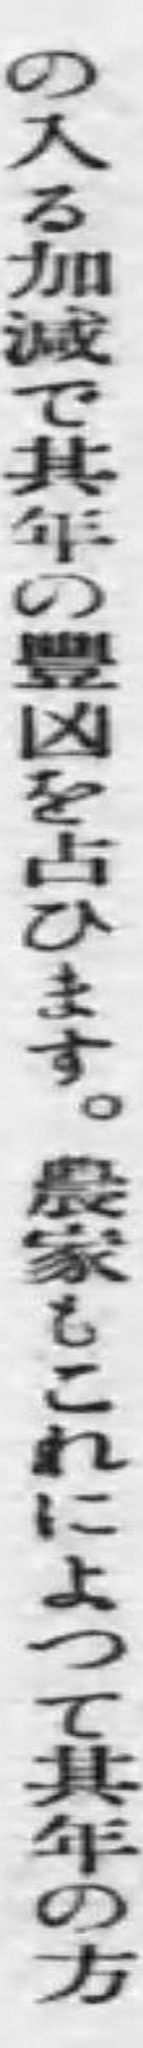の入る加減で其年の豊凶を占ひます。農家もこれによつて其年の方
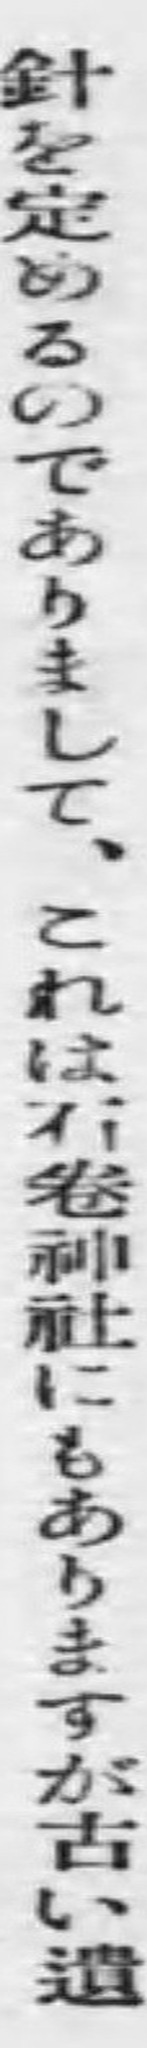針を定めるのでありまして、これは石巻神社にもありますが古い遺
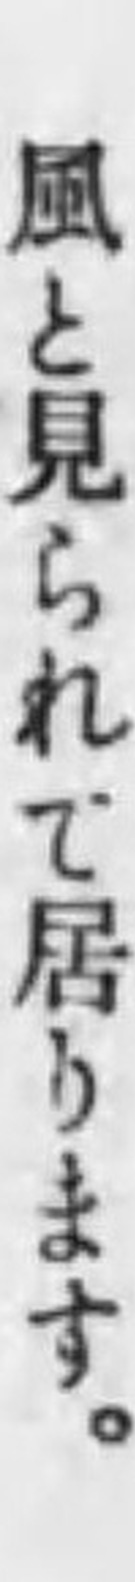風と見られて居ります。
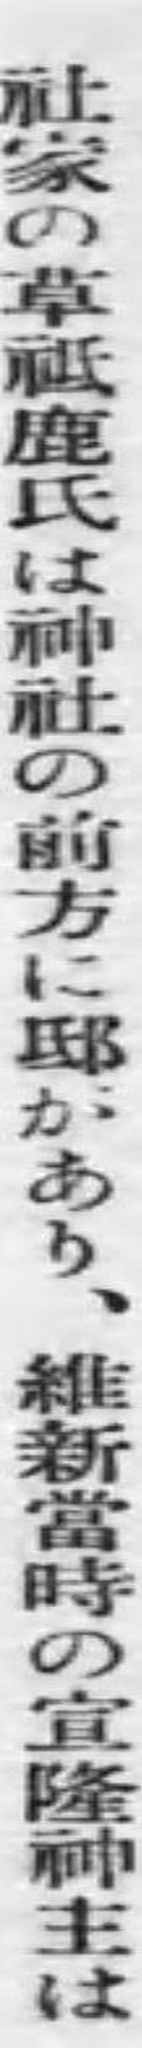社家の草祗鹿氏は神社の前方に邸があり、維新当時の宣隆神主は
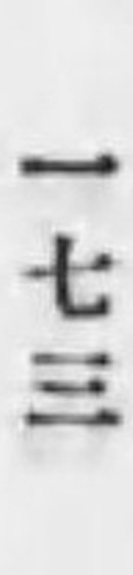一七三

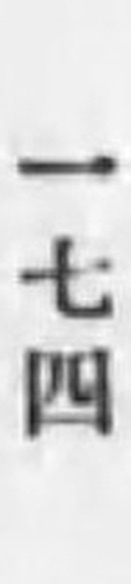一七四
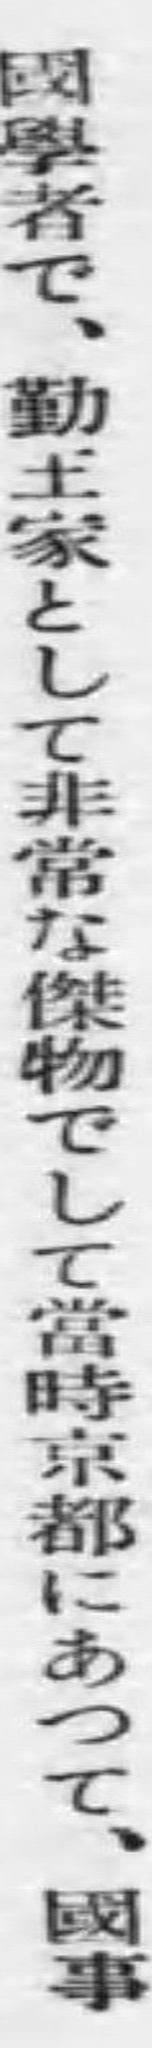国学者で、勤王家として非常な傑物でして当時京都にあつて、国事
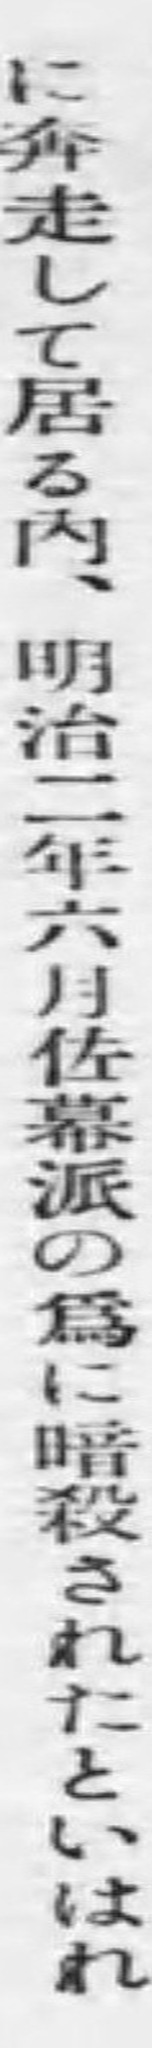に奔走して居る内、明治二年六月佐幕派の為に暗殺されたといはれ
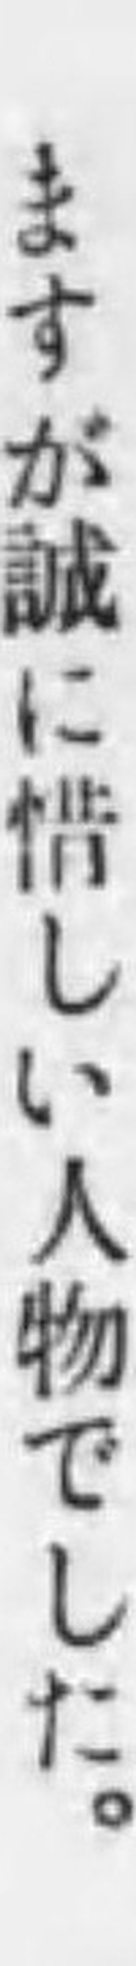ますが誠に惜しい人物でした。
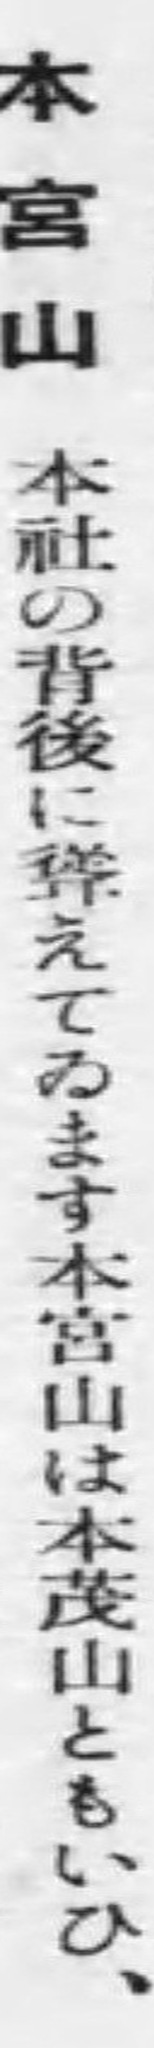本宮山本社の背後に聳えてゐます本宮山は本茂山ともいひ、
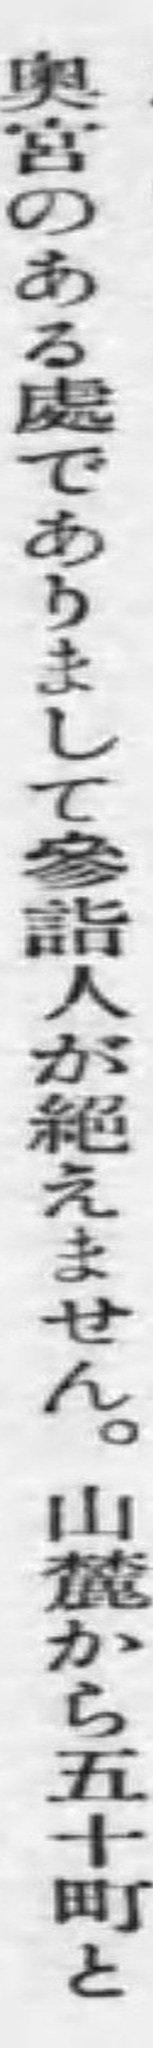奥宮のある処でありまして参詣人が絶えません。山麓から五十町と
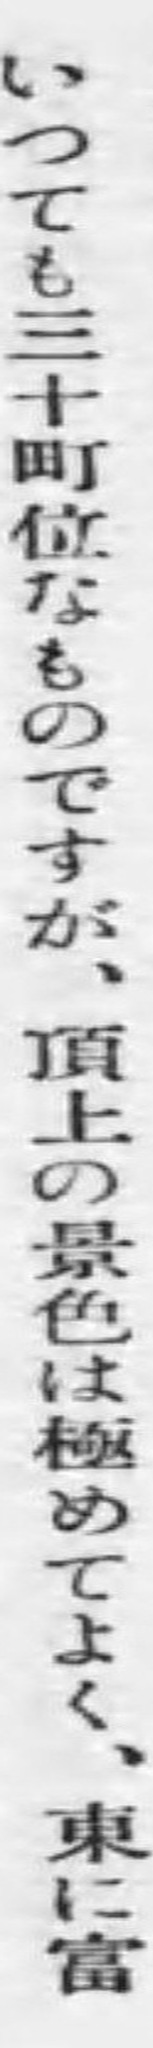いつても三十町位なものですが、頂上の景色は極めてよく、東に富
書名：東三河道中記 : 豊橋市及其附近案内
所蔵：国立国会図書館 National Diet Library, JAPAN
